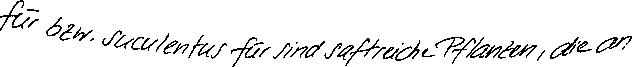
für bzw. suculentus für sind saftreiche Pflanzen, die an
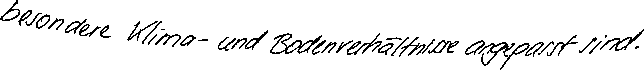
besondere Klima- und Bodenverhältnisse angepasst sind.
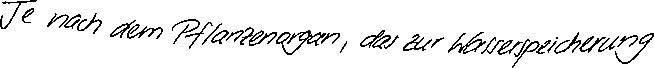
Je nach dem Pflanzenorgan, das zur Wasserspeicherung
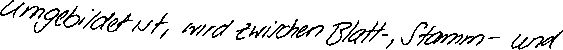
umgebildet ist, wird zwischen Blatt-, Stamm- und
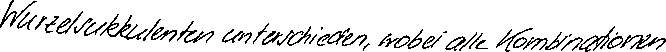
Wurzelsukkulenten unterschieden, wobei alle Kombinationen
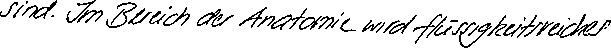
sind. Im Bereich der Anatomie wird flüssigkeitsreiches
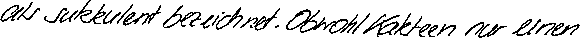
als sukkulent bezeichnet. Obwohl Kakteen nur einen
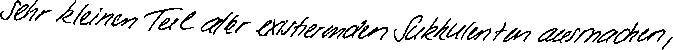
sehr kleinen Teil aller existierenden Sukkulenten ausmachen,
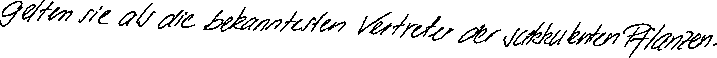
gelten sie als die bekanntesten Vertreter der sukkulenten Pflanzen
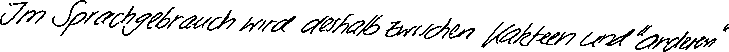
Im Sprachgebrauch wird deshalb zwischen Kakteen und "anderen"
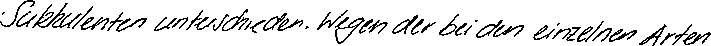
Sukkulenten unterschieden. Wegen der bei den einzelnen Arten
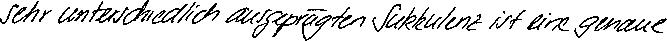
sehr unterschiedlich ausgeprägten Sukkulenz ist eine genaue
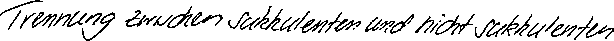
Trennung zwischen sukkulenten und nicht sukkulenten
